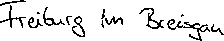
Freiburg im Breisgau
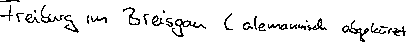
Freiburg im Breisgau (alemannisch abgekürzt
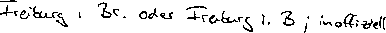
Freiburg i. Br. oder Freiburg i. B.; inoffiziell
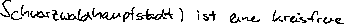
Schwarzwaldhauptstadt) ist eine kreisfreie
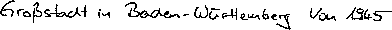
Großstadt in Baden-Württemberg. Von 1945
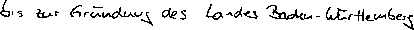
bis zur Gründung des Landes Baden-Württemberg
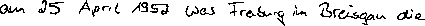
am 25. April 1952 war Freiburg im Breisgau die
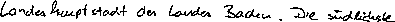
Landeshauptstadt des Landes Baden. Die südlichste
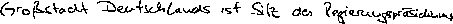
Großstadt Deutschlands ist Sitz des Regierungspräsidiums
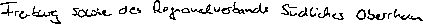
Freiburg sowie des Regionalverbands Südlicher Oberrhein
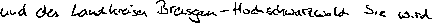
und des Landkreises Breisgau-Hochschwarzwald. Sie wird
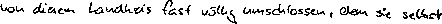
von diesem Landkreis fast völlig umschlossen, dem sie selbst
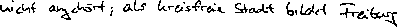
nicht angehört; als kreisfreie Stadt bildet Freiburg
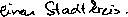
einen Stadtkreis.
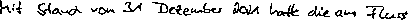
Mit Stand vom 31. Dezember 2021 hatte die am Fluss
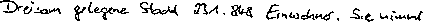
Dreisam gelegene Stadt 231.848 Einwohner. Sie nimmt
